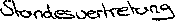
Standesvertretung
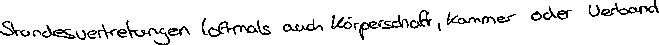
Standesvertretungen (oftmals auch Körperschaft, Kammer oder Verband
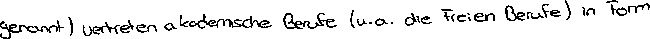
Verband genannt) vertreten akademische Berufe (u. a. die Freien Berufe) in Form
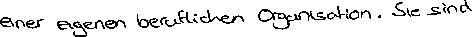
einer eigenen beruflichen Organisation. Sie sind
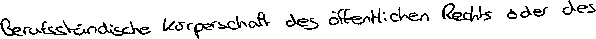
Berufsständische Körperschaft des öffentlichen Rechts oder des
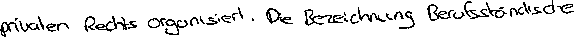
privaten Rechts organisiert. Die Bezeichnung Berufsständische
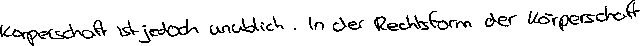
Körperschaft ist jedoch unüblich.In der Rechtsform der Körperschaft
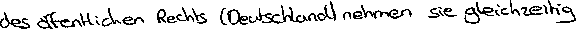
des öffentlichen Rechts (Deutschland) nehmen sie gleichzeitig
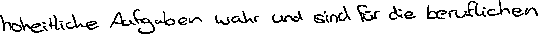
hoheitliche Aufgaben wahr und sind für die beruflichen
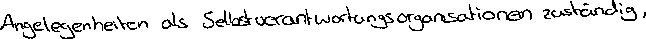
Angelegenheiten als Selbstverwaltungsorganisationen zuständig,
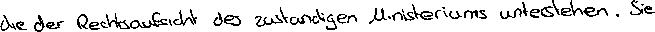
die der Rechtsaufsicht des zuständigen Ministeriums unterstehen. Sie
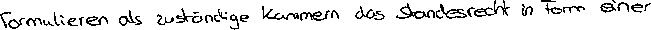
formulieren als zuständige Kammern das Standesrecht in Form einer
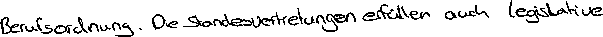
Berufsordnung. Die Standesvertretungen erfüllen auch legislative
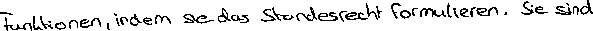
Funktionen, indem sie das Standesrecht formulieren. Sie sind
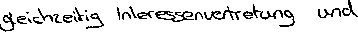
gleichzeitig Interessenvertretung und
